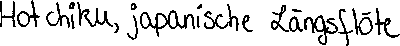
Hotchiku, japanische Längsflöte
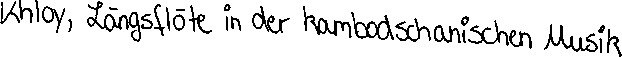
Khloy, Längsflöte in der kambodschanischen Musik
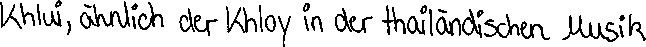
Khlui, ähnlich der Khloy in der thailändischen Musik
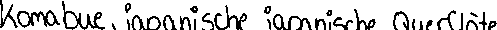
Komabue, japanische japanische Querflöte
